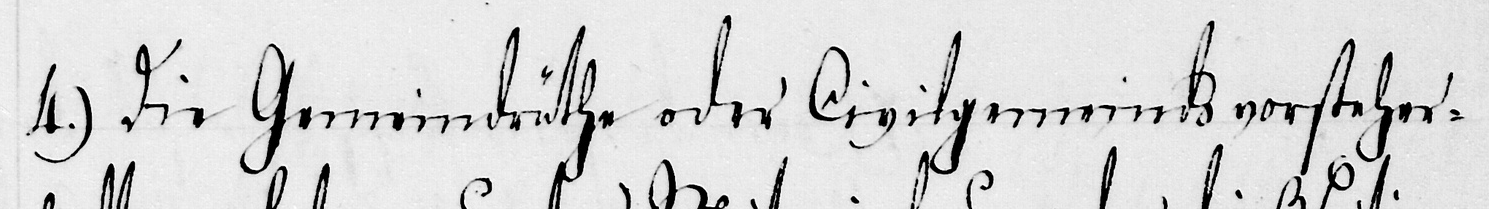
4.) Die Gemeindräthe oder Civilgemeindsvorsteher¬
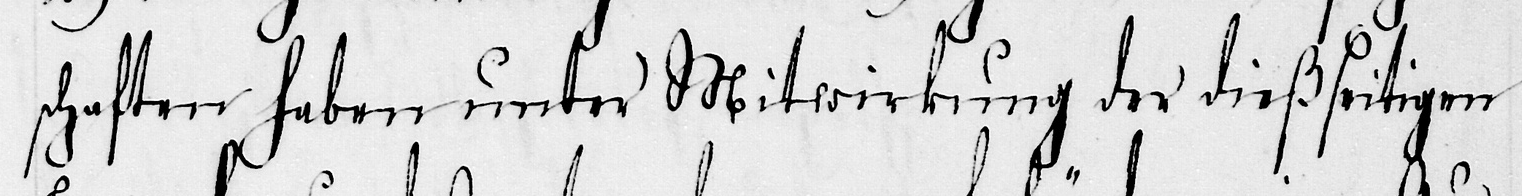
schaften haben unter Mitwirkung der dießseitigen
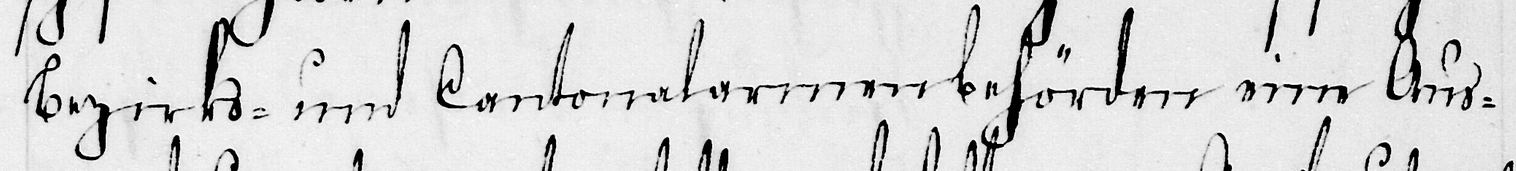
Bezirks- und Cantonalarmenbehörden eine Aus¬
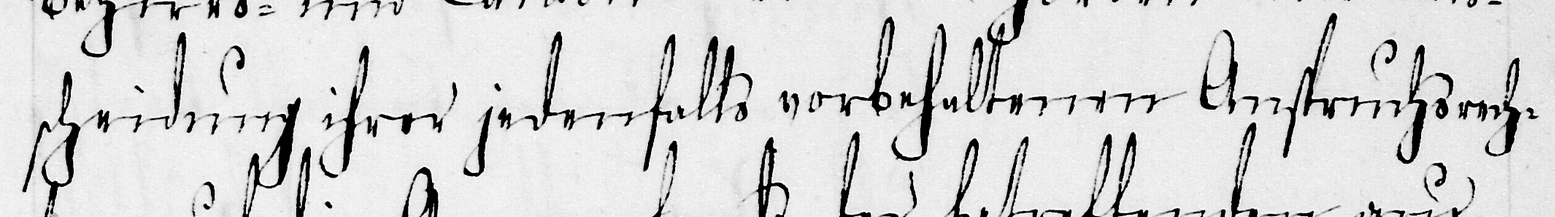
scheidung ihrer jedenfalls vorbehaltenen Anspruchsrech¬
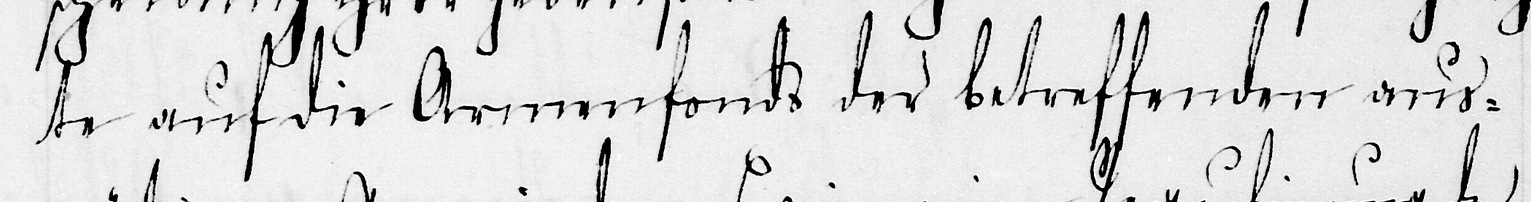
te auf die Armenfonds der betreffenden aus¬
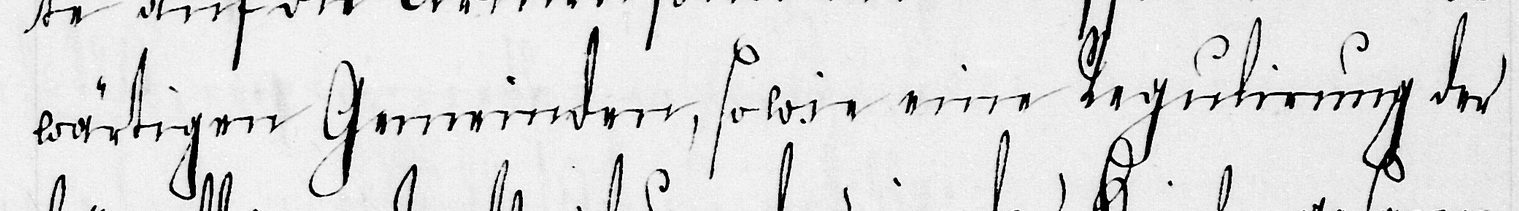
wärtigen Gemeinden, sowie eine Regulirung der
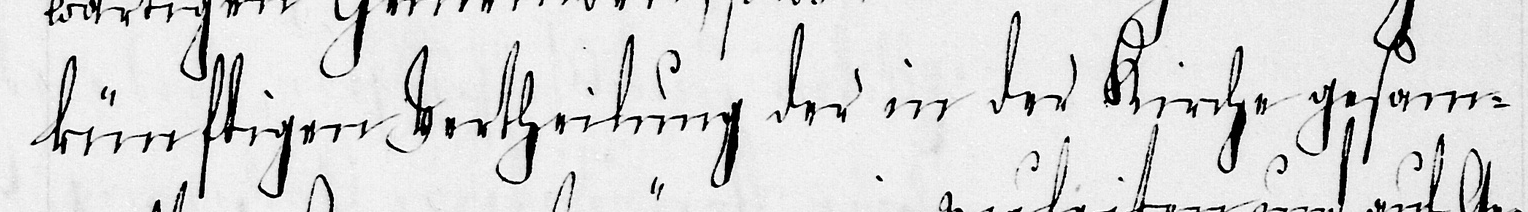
künftigen Vertheilung der in der Kirche gesam¬
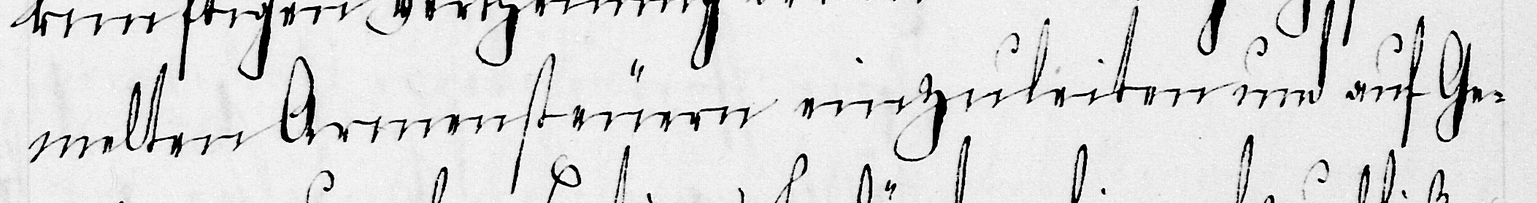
melten Armensteuern einzuleiten und auf Ge¬
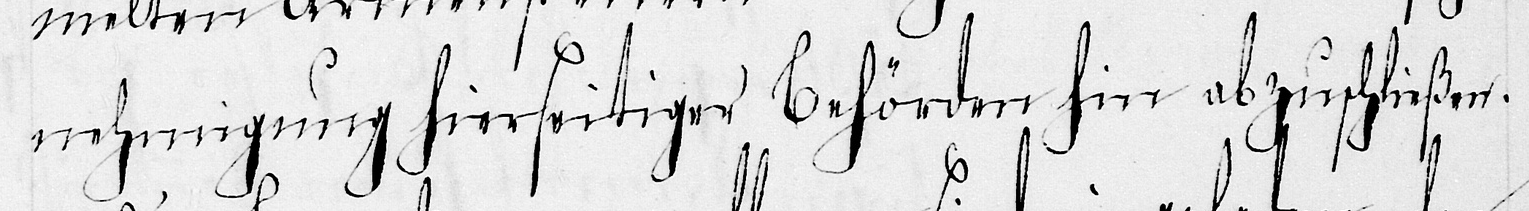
nehmigung hierseitiger Behörden hin abzuschließen.
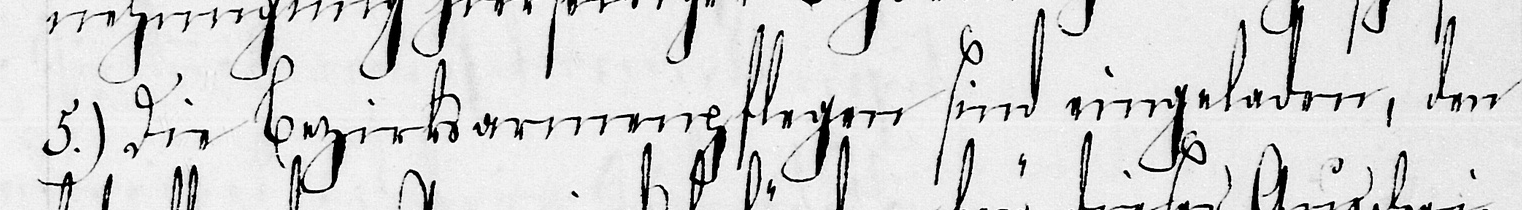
5.) Die Bezirksarmenpflegen sind eingeladen, den
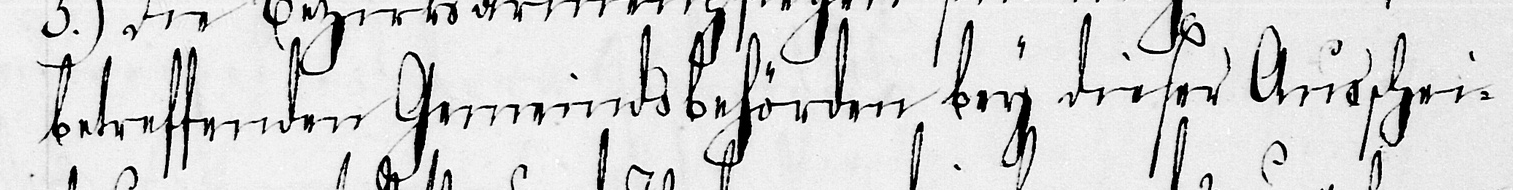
betreffenden Gemeindsbehörden bey dieser Ausschei¬
